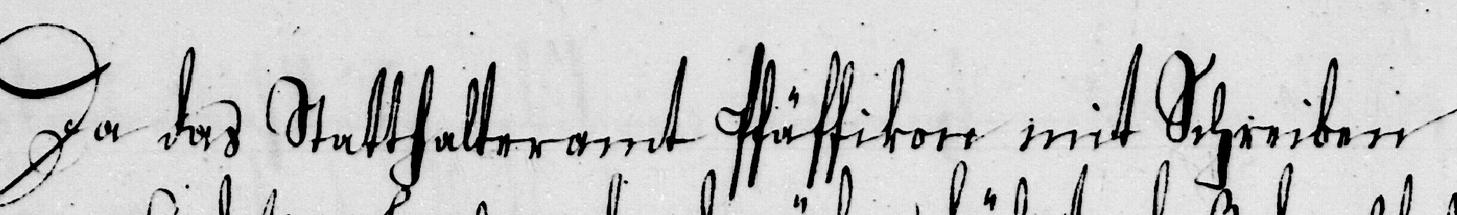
Da das Statthalteramt Pfäffikon mit Schreiben
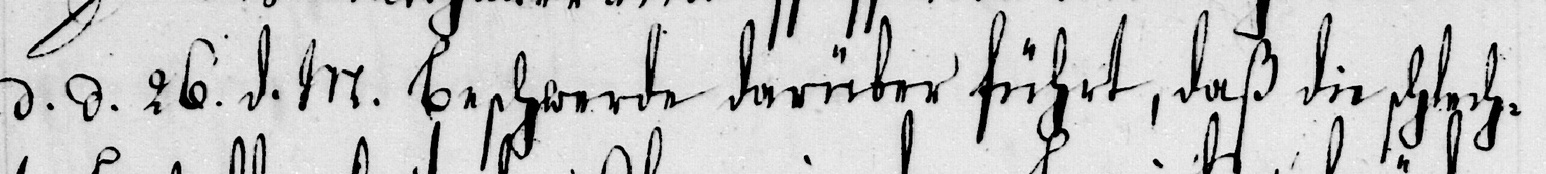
d. d. 26. d. M. Beschwerde darüber führt, daß die schlech¬
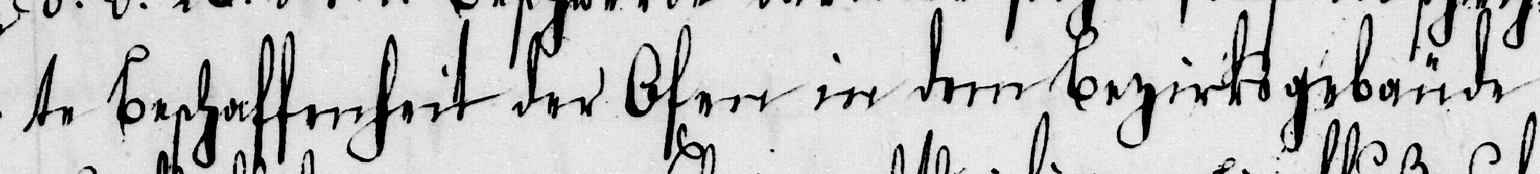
te Beschaffenheit der Ofen in dem Bezirksgebäude
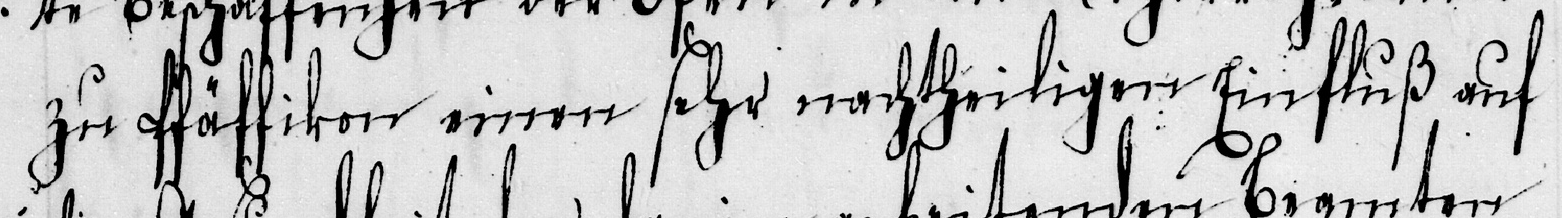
zu Pfäffikon einen sehr nachtheiligen Einfluß auf
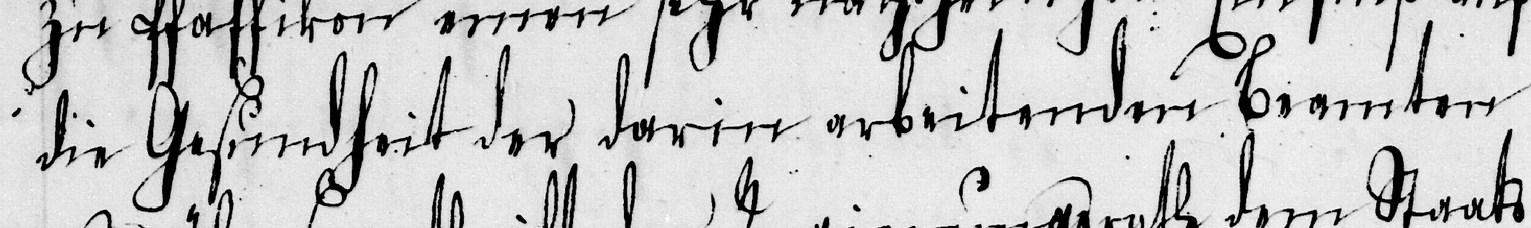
die Gesundheit der darin arbeitenden Beamten
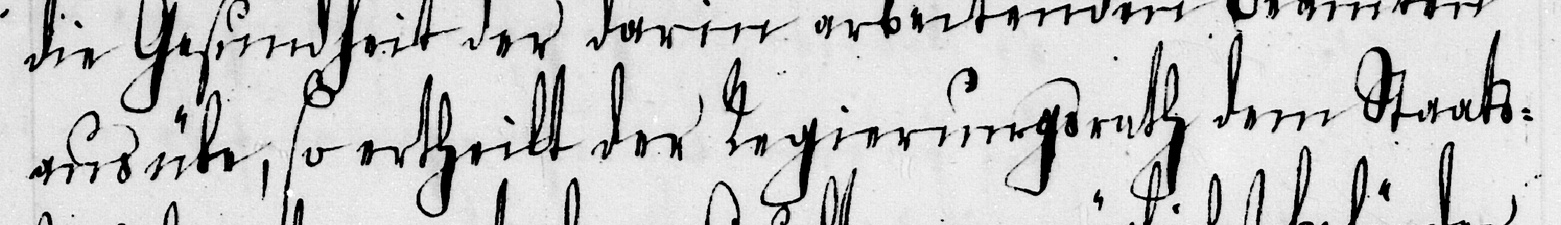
ausübe, so ertheilt der Regierungsrath dem Staats¬
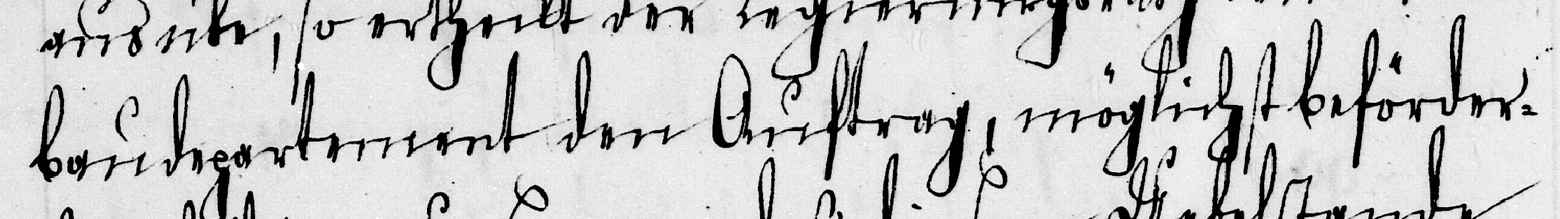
baudepartement den Auftrag, möglichst beförder¬
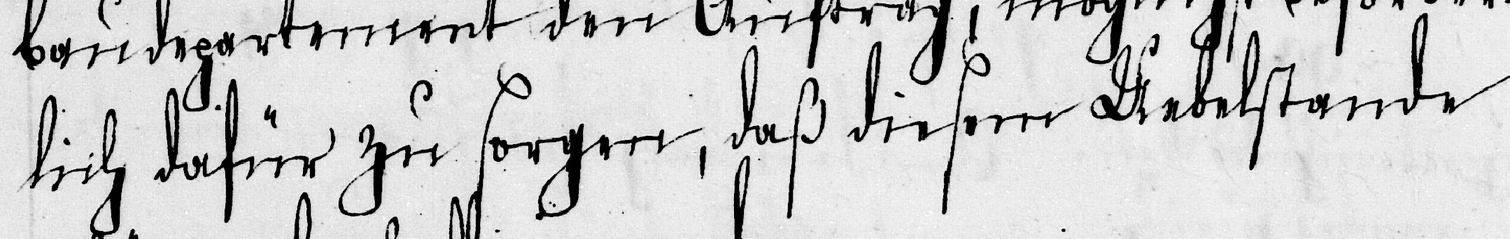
lich dafür zu sorgen, daß diesem Uebelstande
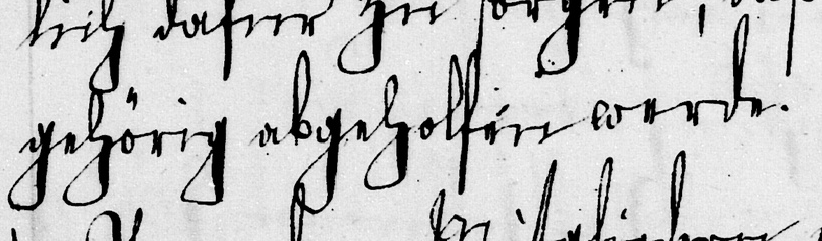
gehörig abgeholfen werde.
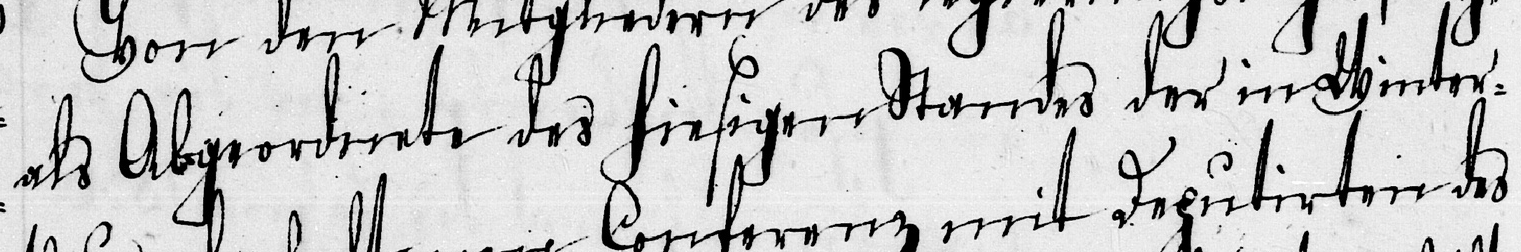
als Abgeordnete des hiesigen Standes der in Winter¬
